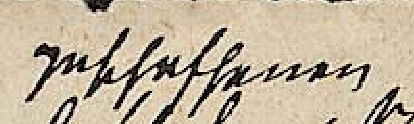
geschaffenen
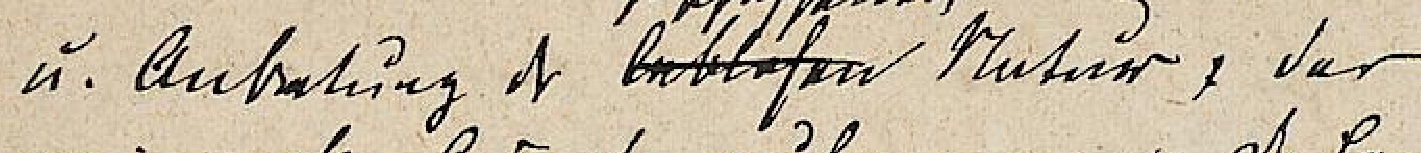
u. Anbetung dr leblosen Natur, der
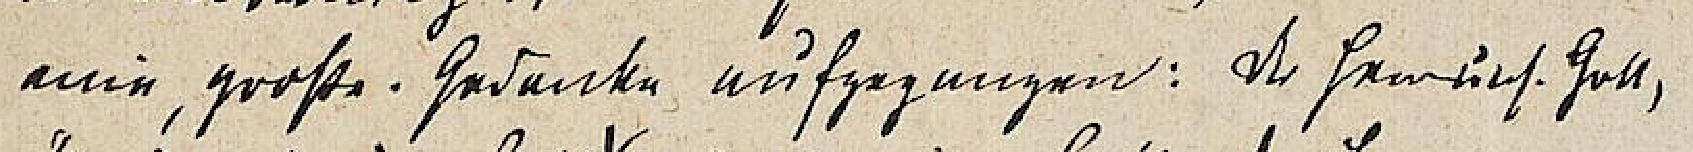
eine, große Gedanke aufgegangen: Der Herr uns. Gott,
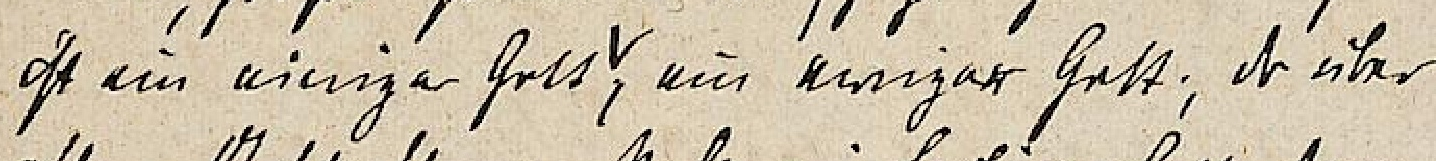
ist ein einiger Gott, ein ewiger Gott, dr über
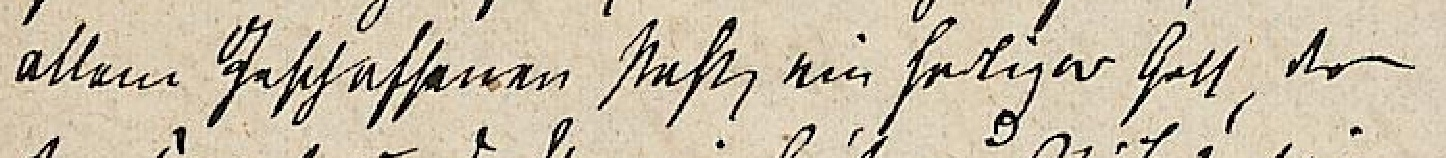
allem Geschaffenem steht, ein heiliger Gott der
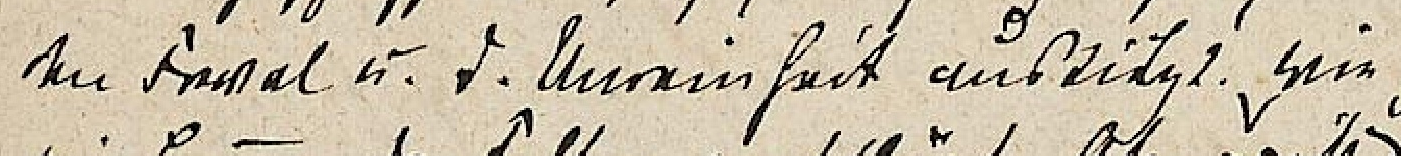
den Frevel u. d. Unreinheit austilgt. wie
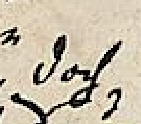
doch
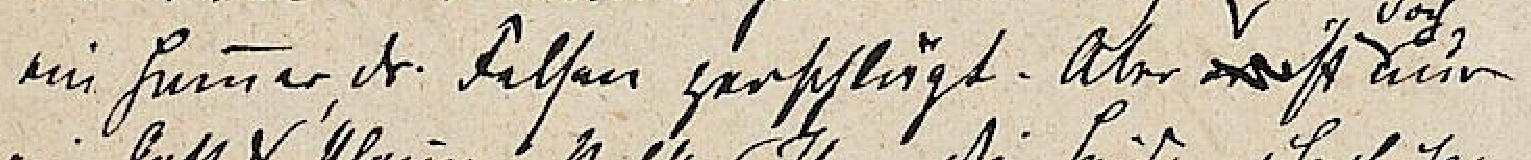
ein Hamer dr. Felsen zerschlägt. Aber er ist nur
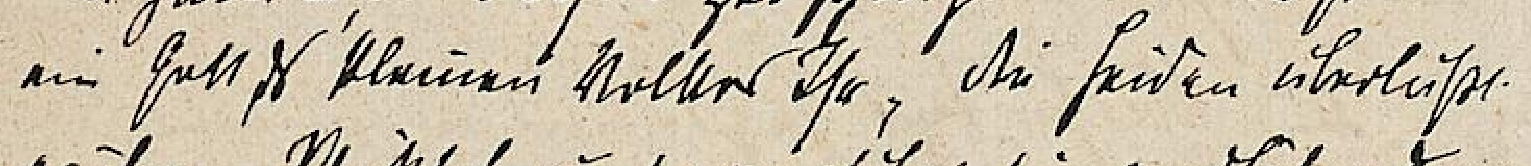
ein Gott des kleinen Volkes Isr, die Heiden überläßt
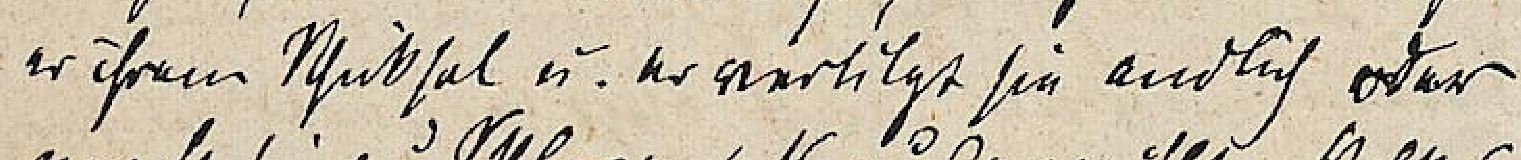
er ihren Schiksal u. er vertilgt sie endlich oder
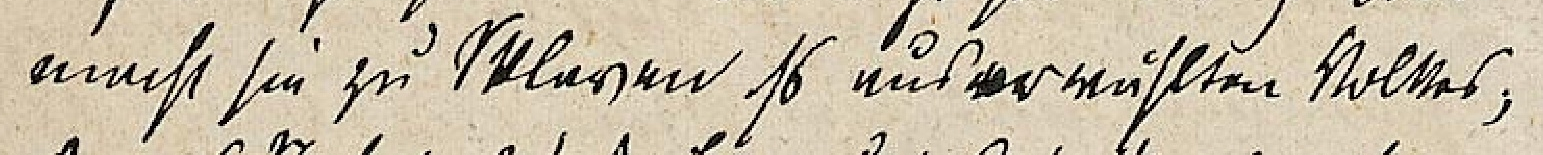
macht sie zu Sklaven ss auserwählten Volkes,
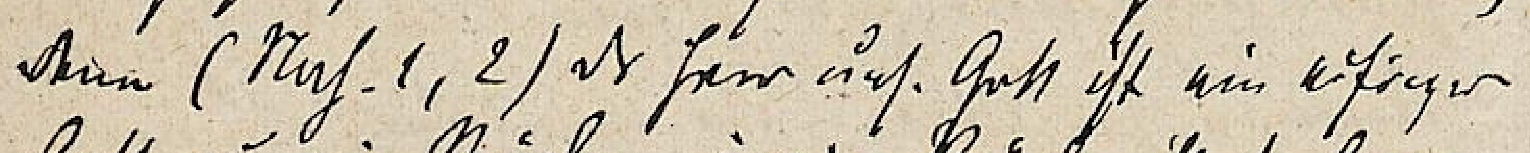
denn (Nah. 1, 2) dr Her uns. Gott ist ein eifriger
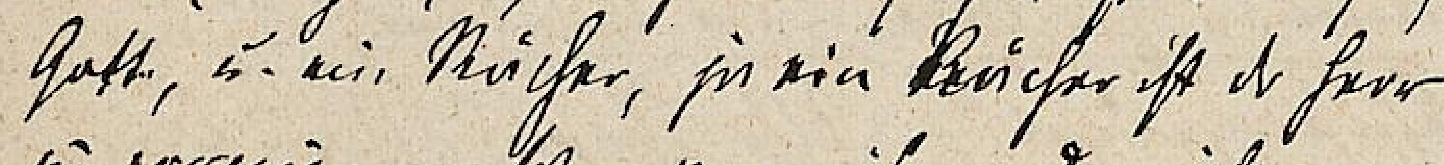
Gott, u. ein Rächer, ja ein Rächer ist dr Herr
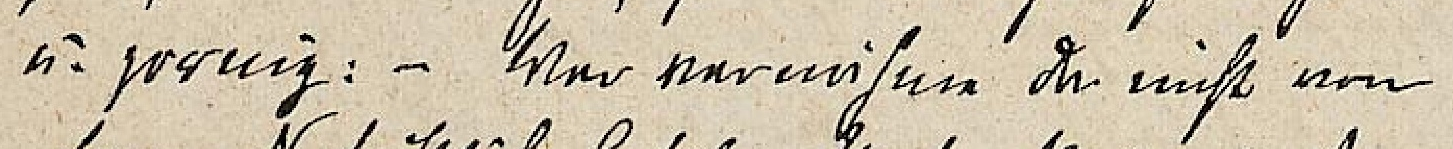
u. zornig: _ Wer vernähme da nicht von
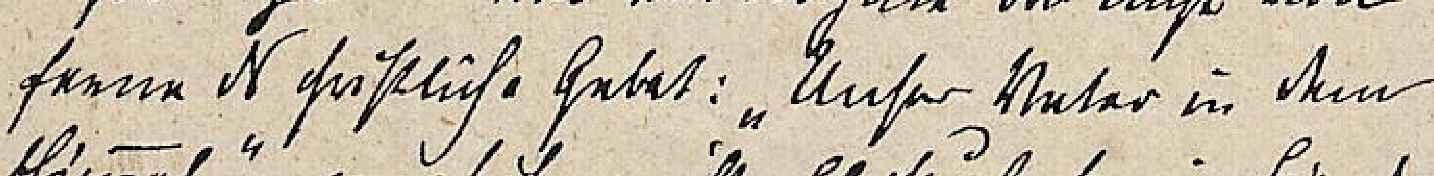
ferne ds christliche Gebet: "Unser Vater in dem
